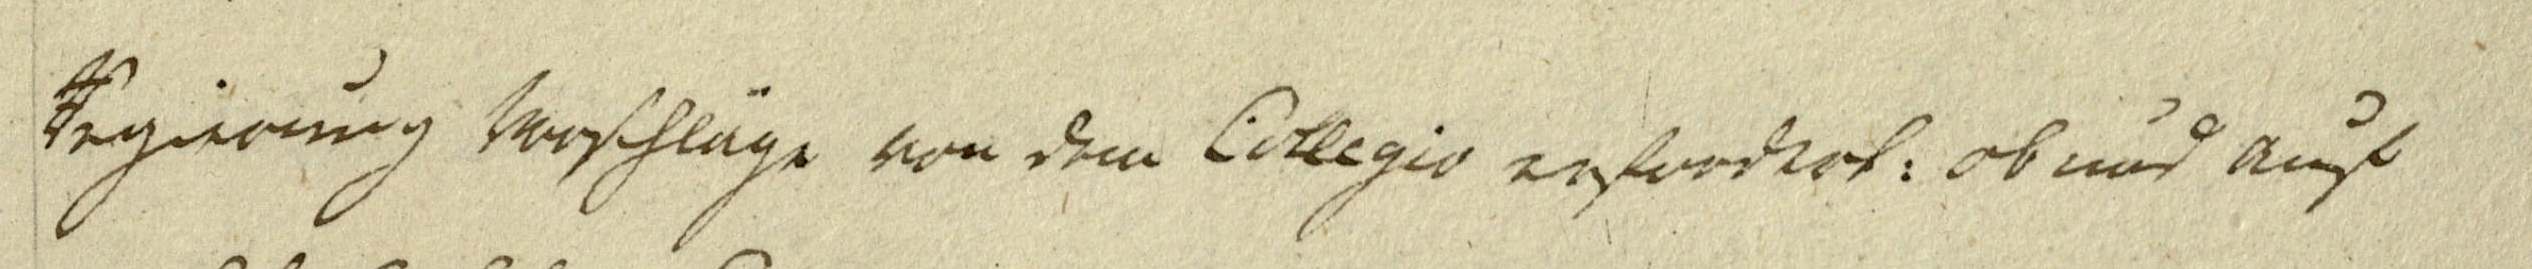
Regierung Vorschläge von dem Collegio erfordert: ob und auf
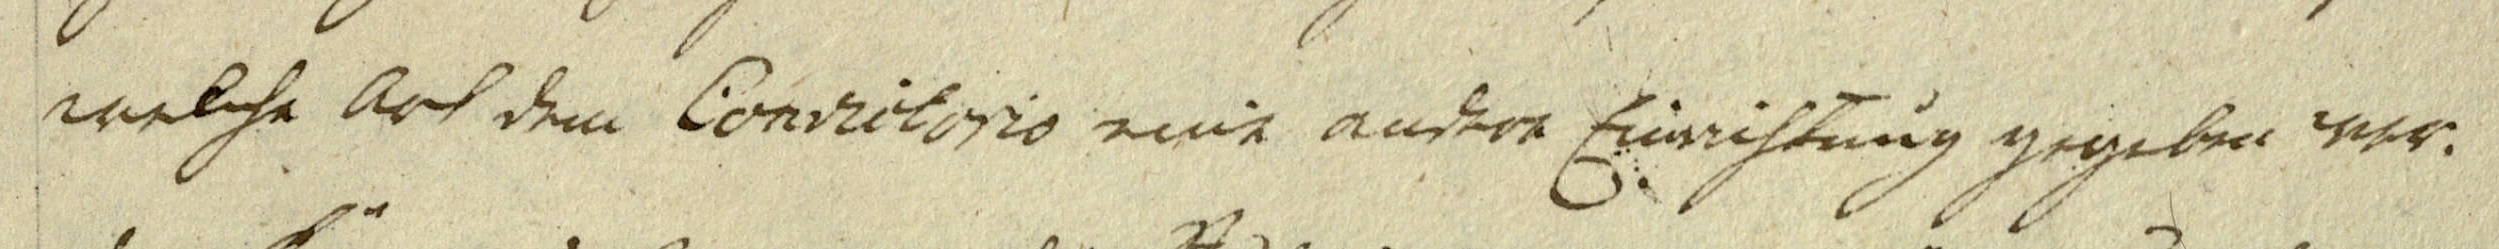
welche Art dem Convictorio eine andere Einrichtung gegeben wer¬
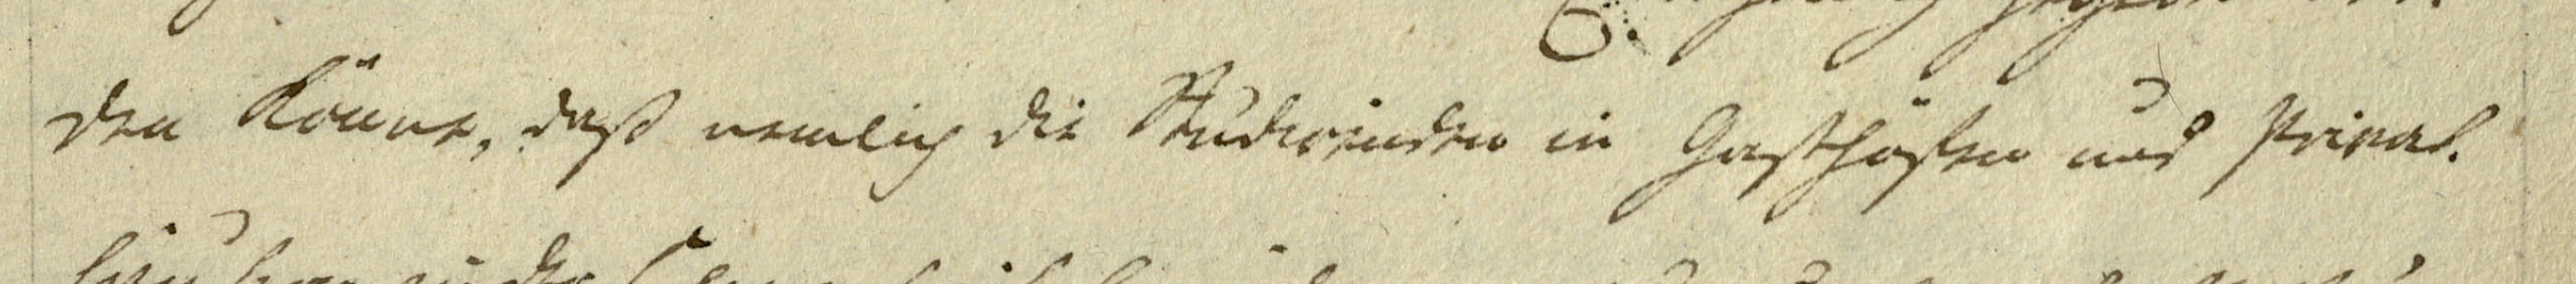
den könne, daß nemlich die Studirenden in Gasthöfen und Privat¬
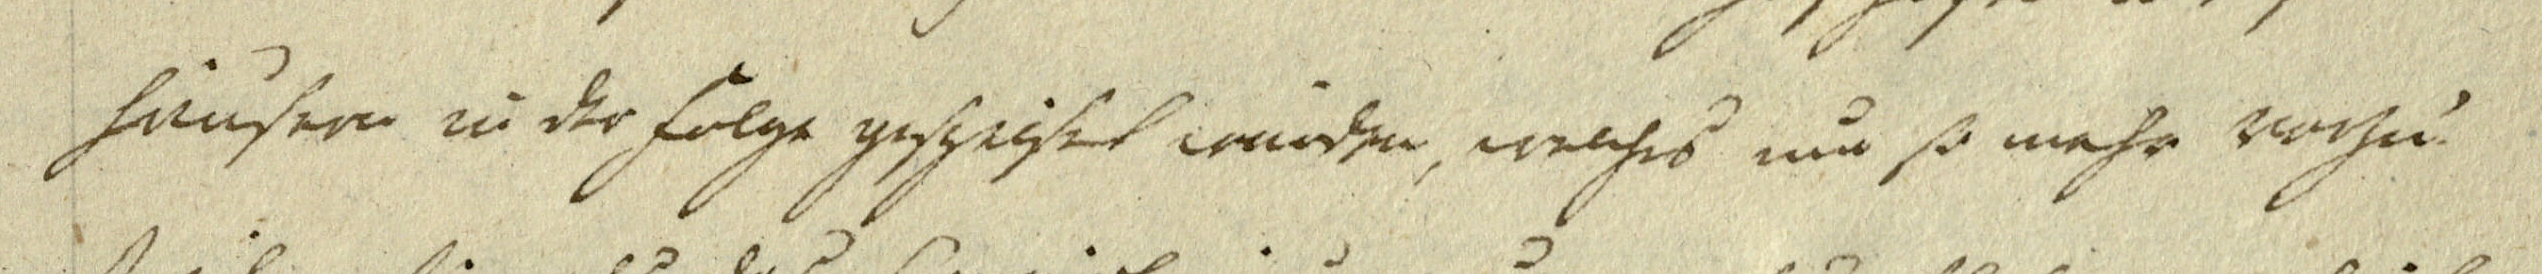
häusern in der Folge gespeiset würden, welches um so mehr vorzu¬
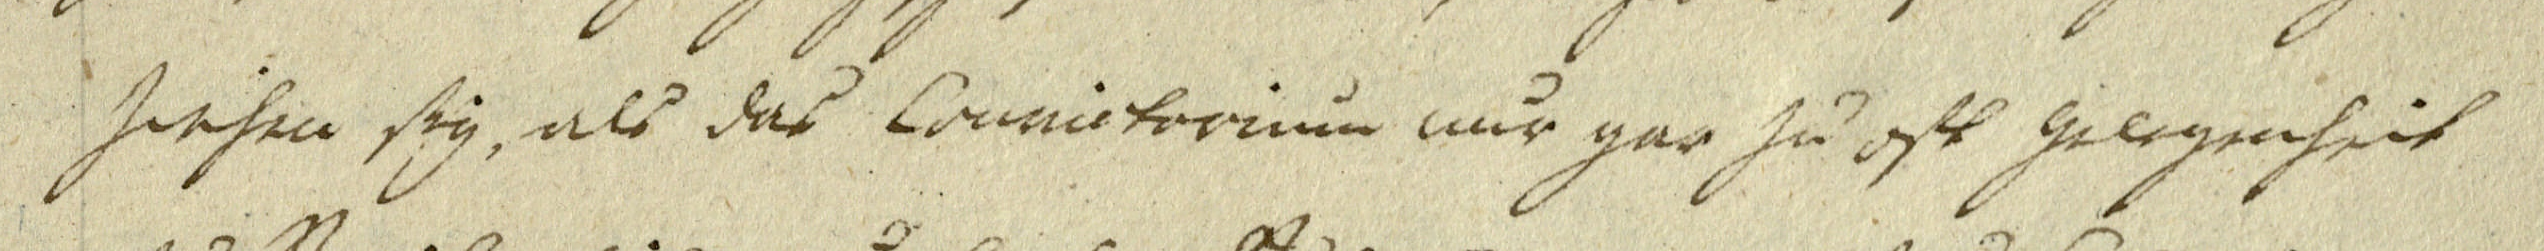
ziehen seÿ, als das Convictorium nur gar zu oft Gelegenheit
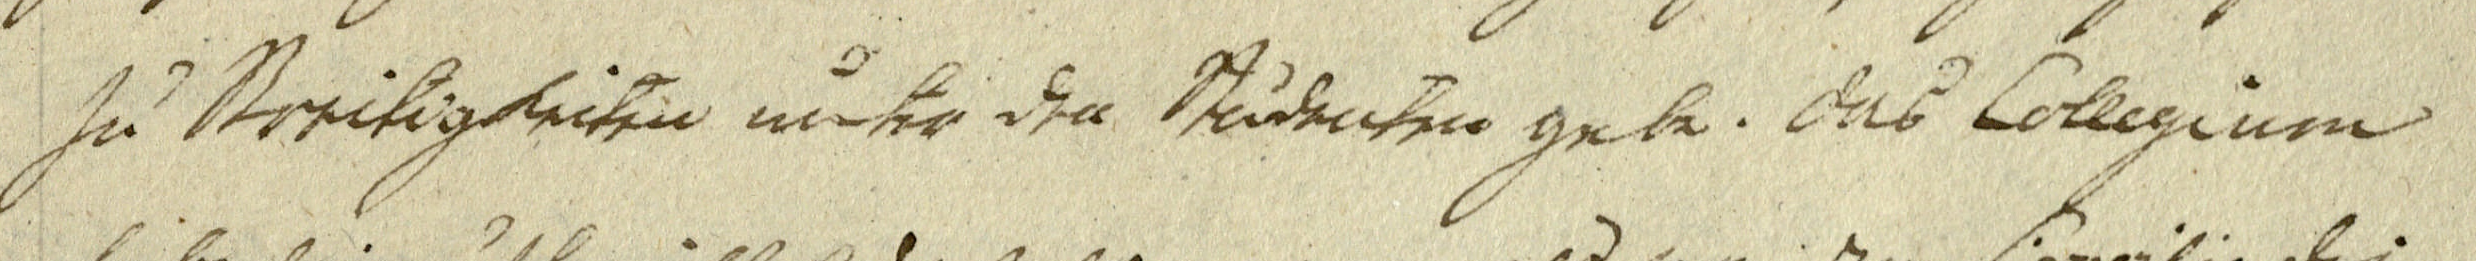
zu Streitigkeiten unter den Studenten gebe. Das Collegium
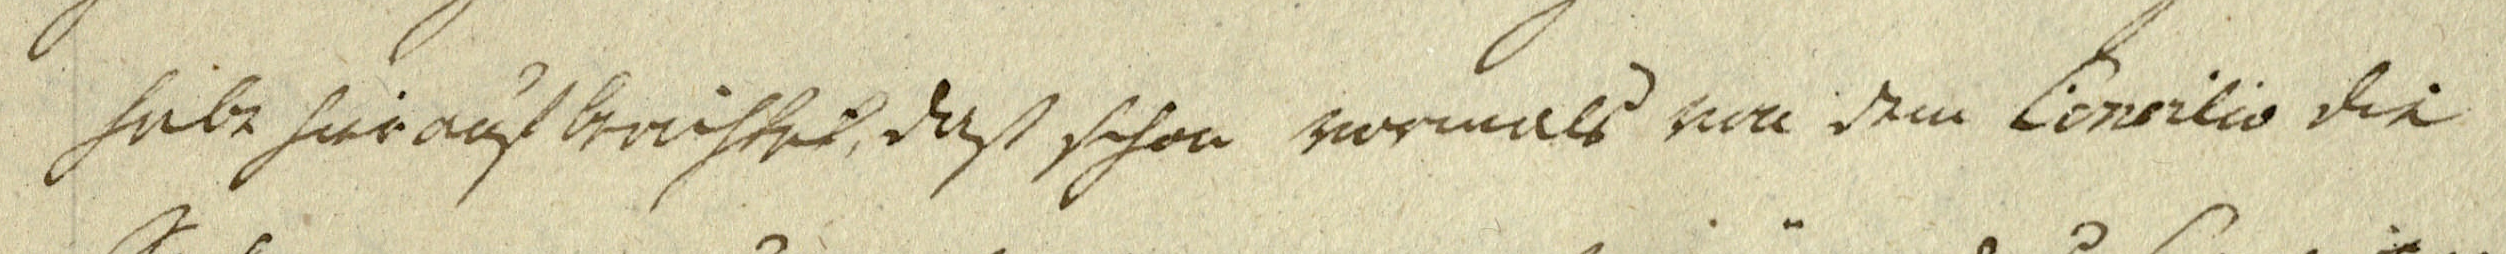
habe hierauf berichtet, daß schon vormals von dem Concilio die
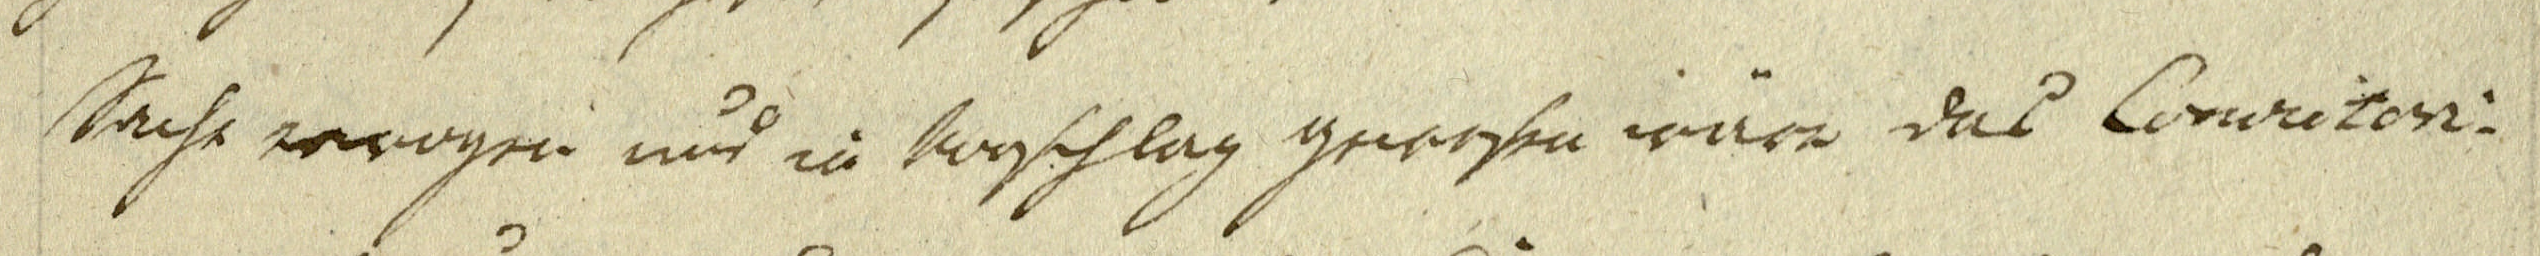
Sache erwogen und in Vorschlag gewesen wäre das Convictori¬
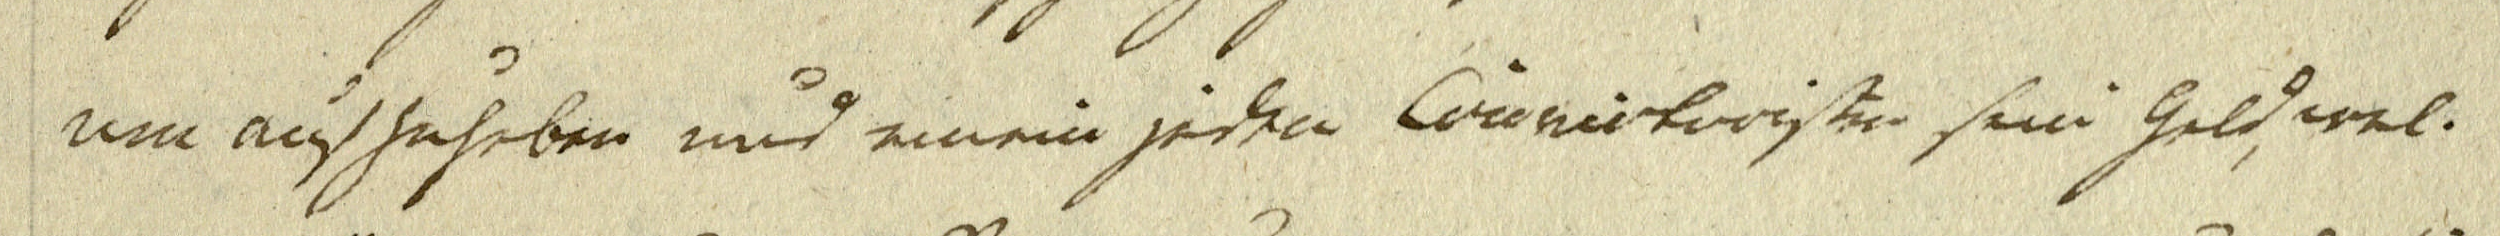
um aufzuheben und einem jeden Convictoristen sein Geld, wel¬
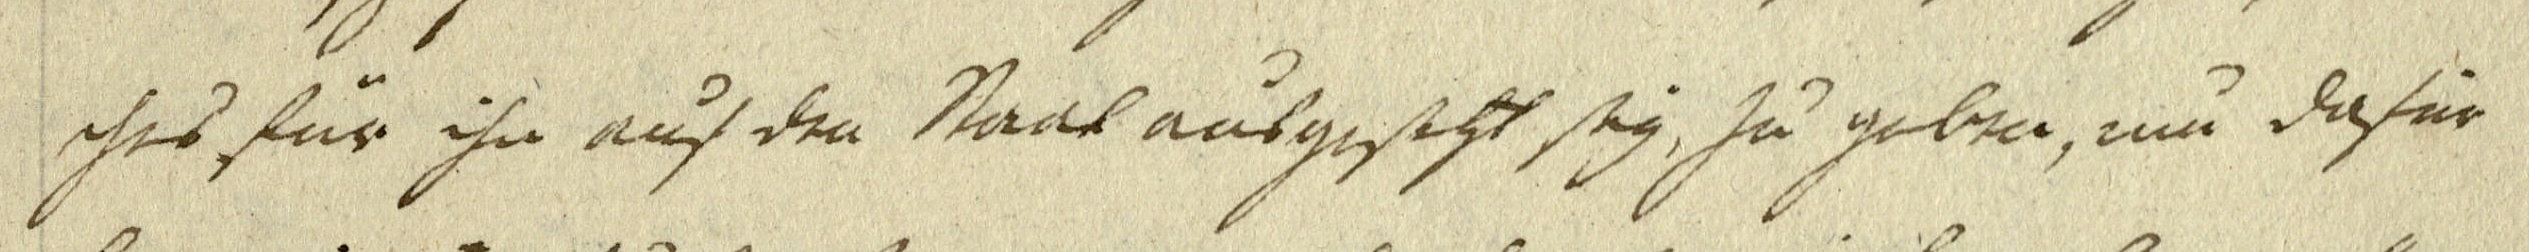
ches für ihn auf den Staat ausgesetzt seÿ, zu geben, um dafür
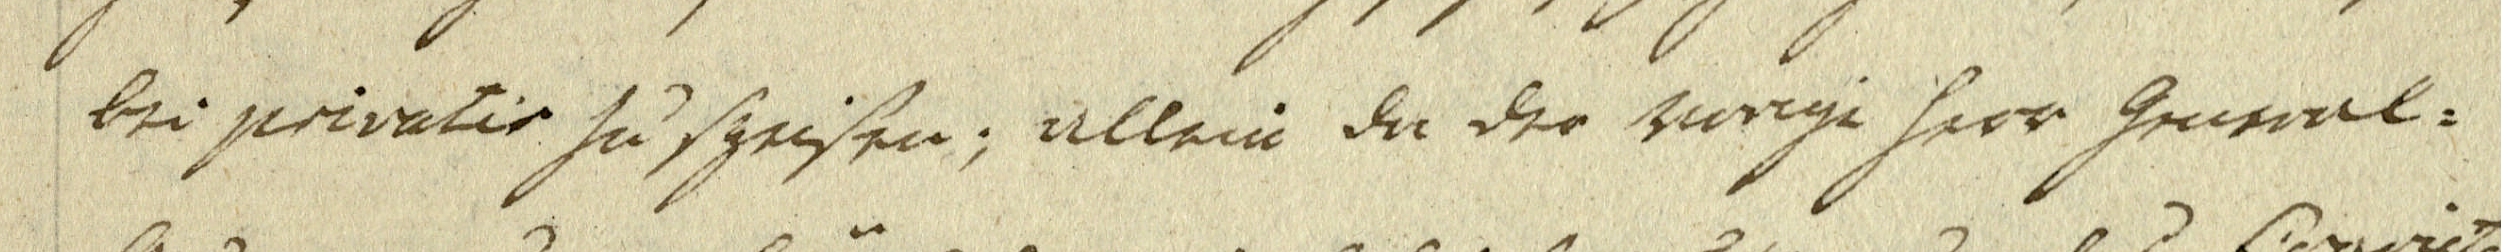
bei privatis zu speisen; allein da der vorige Herr General-
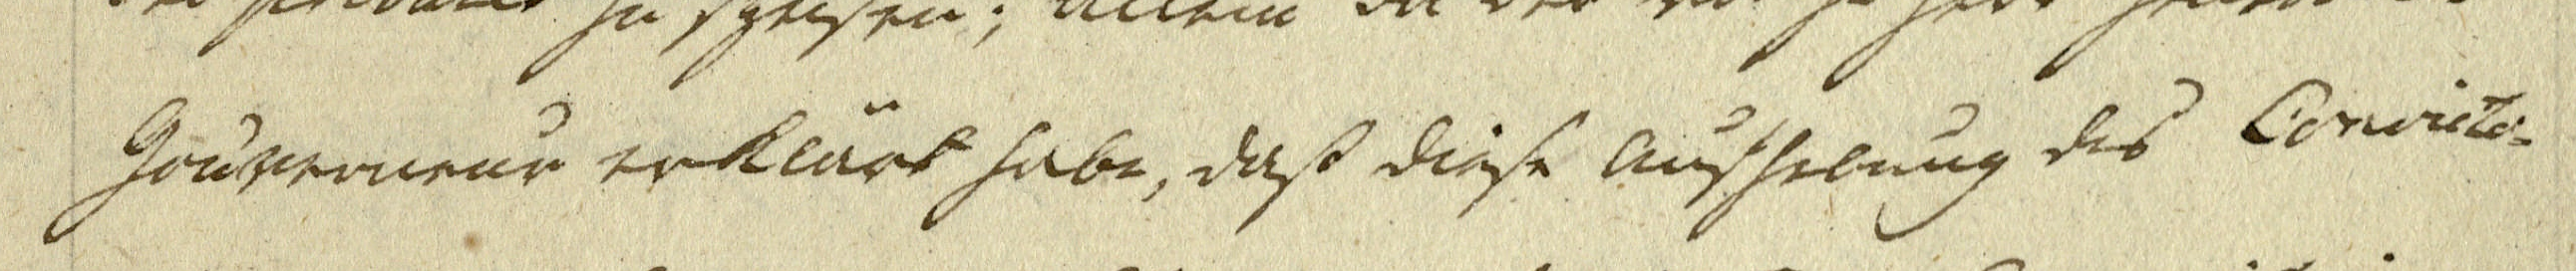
Gouverneur erklärt habe, daß diese Aufhebung des Convicto¬
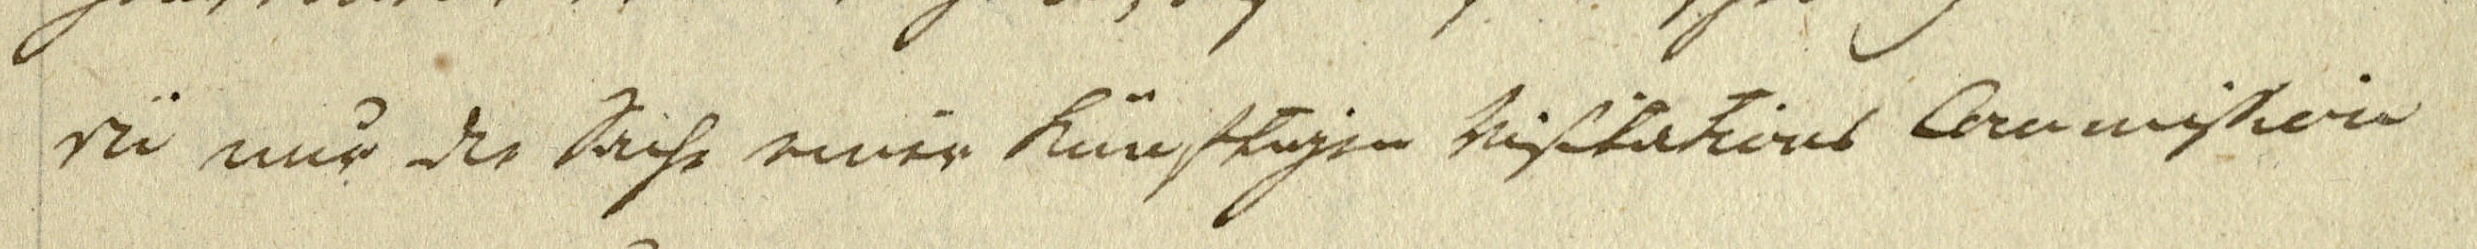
rii nur die Sache einer künftigen Visitations Commission
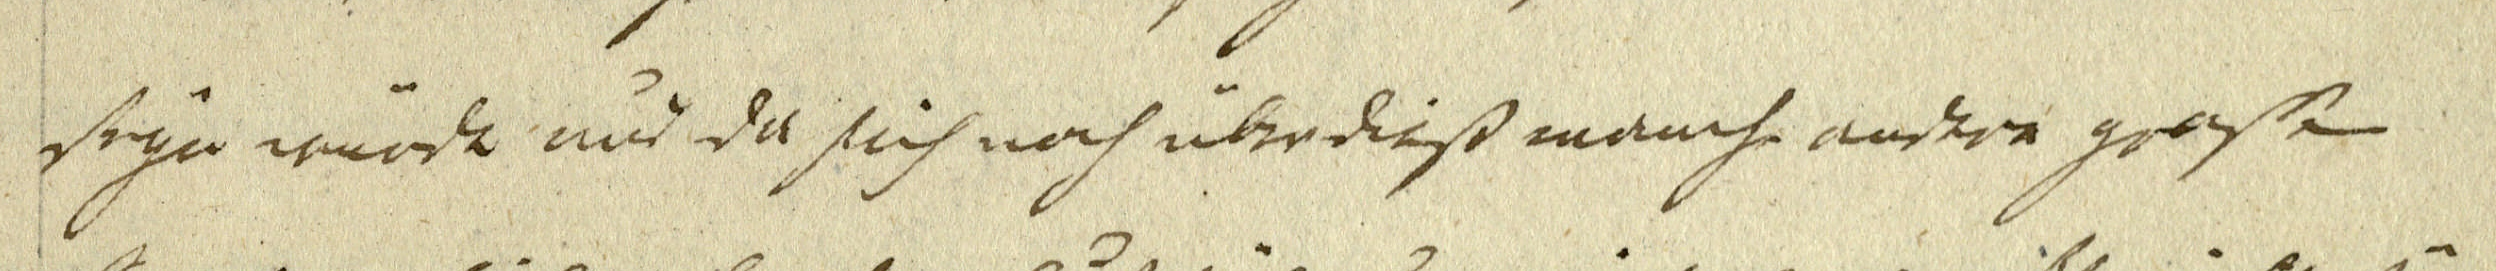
seÿn würde und da sich noch über dies manche andere grosse
